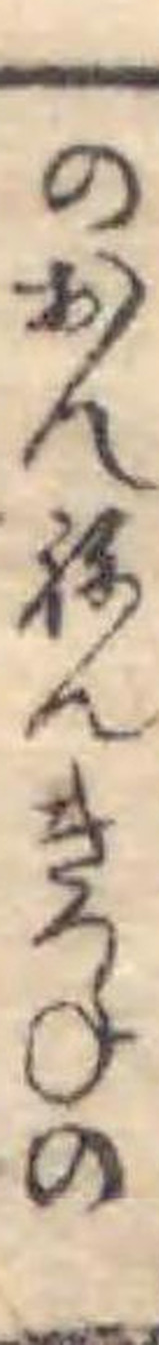のおんねんきつねの
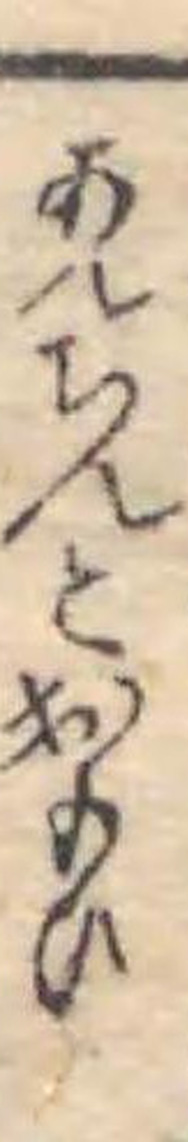あんちんとおもひ
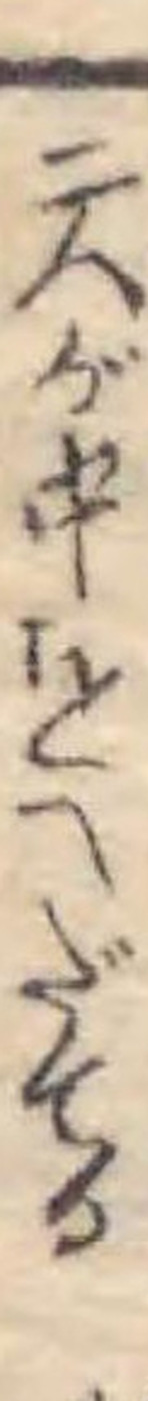二人が中をへだてる
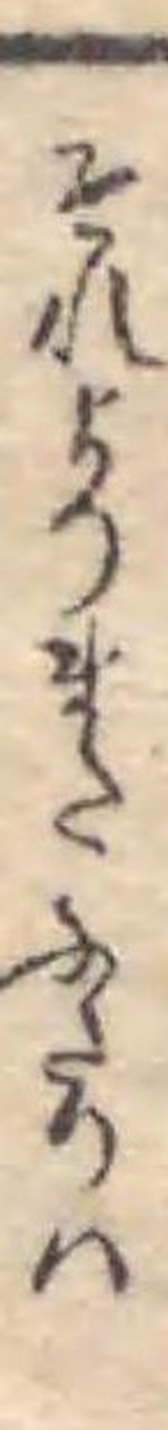それよりまたふたりは
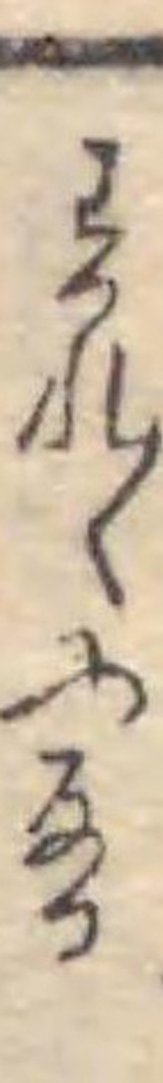わかれ〳〵になる
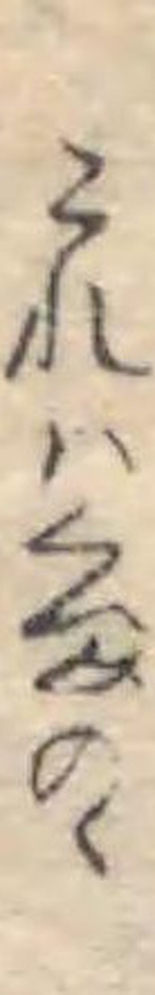これはくまのゝ
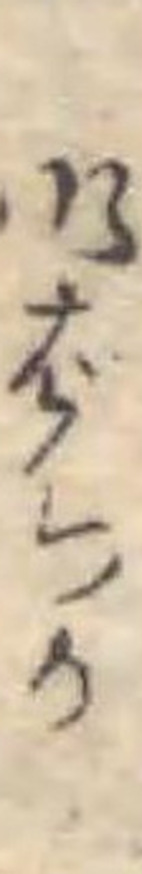御ばつか
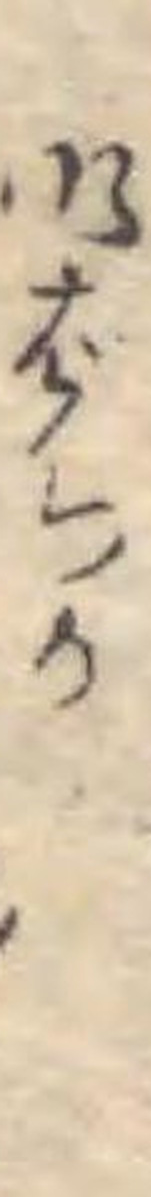御ばつか
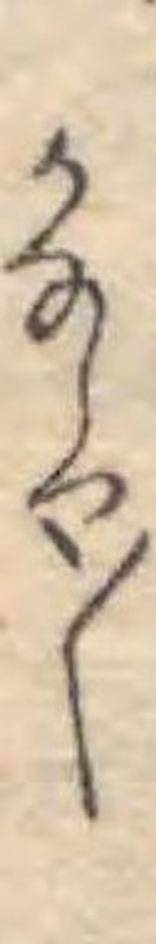かなしや〳〵
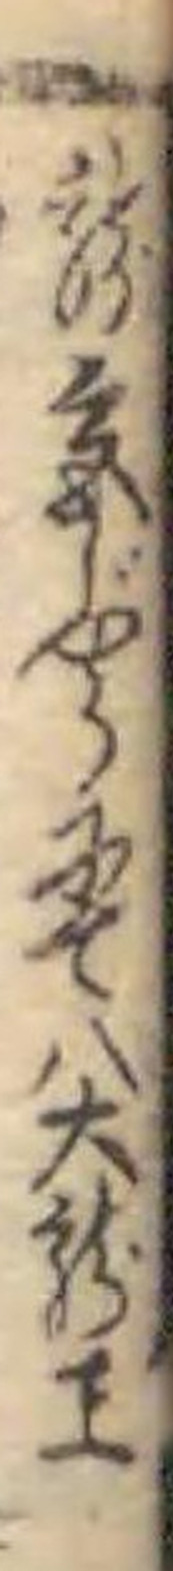竜宮じやうにて八大龍王
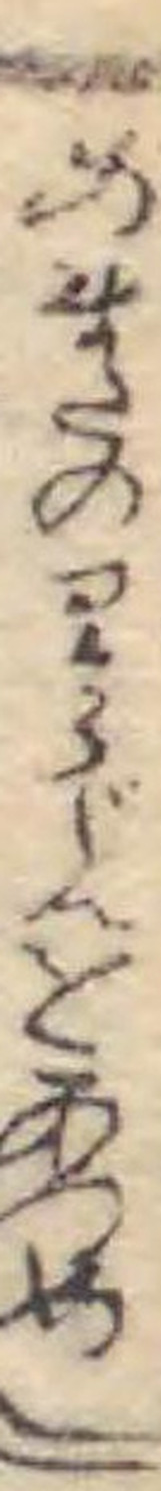あまたのりうじんをあつめ
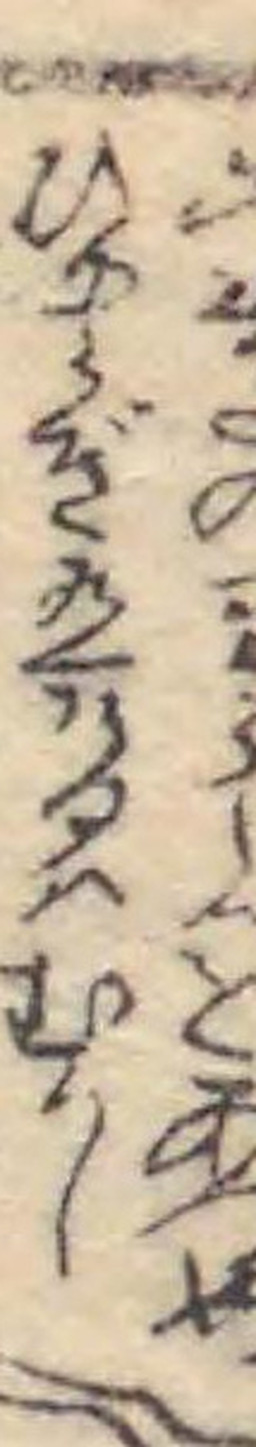ひやうぎ有けるはむかし
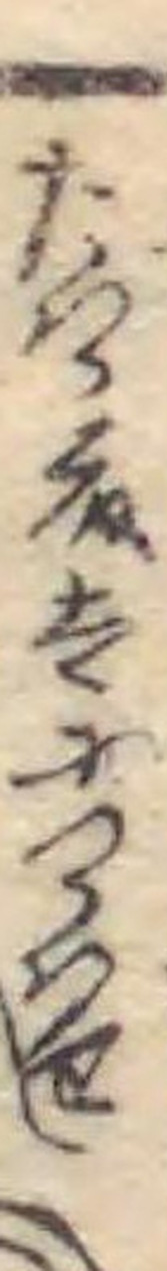たはら藤太につかはせし
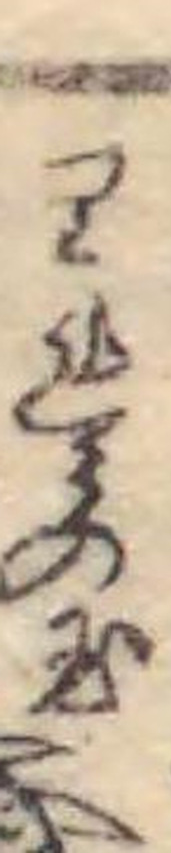りれうの玉
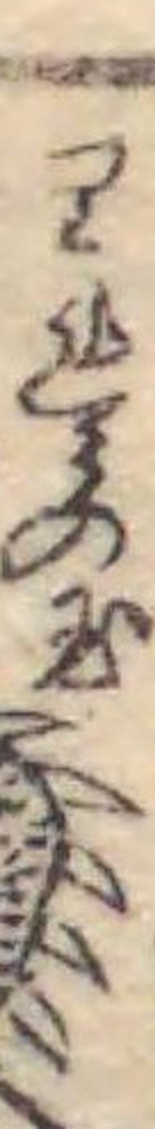りれうの玉
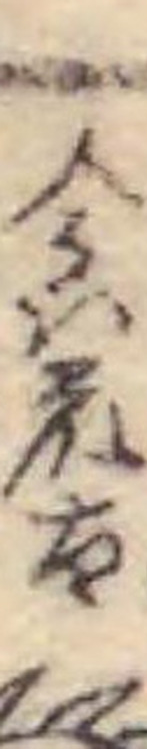今は藤太
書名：鐘入七人化粧 : 3巻
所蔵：国立国会図書館 National Diet Library, JAPAN
